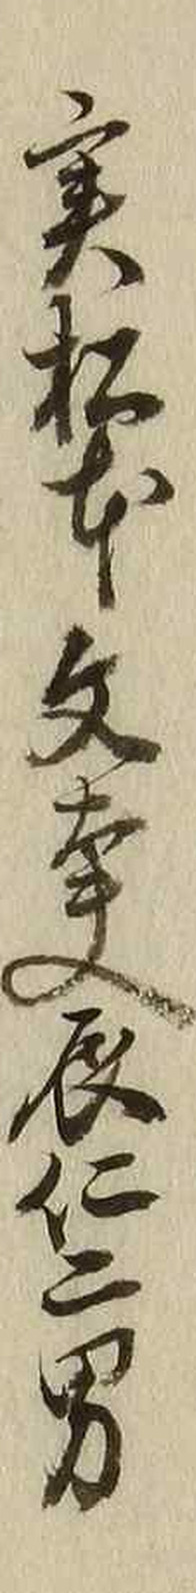実松本文太夫辰仁二男
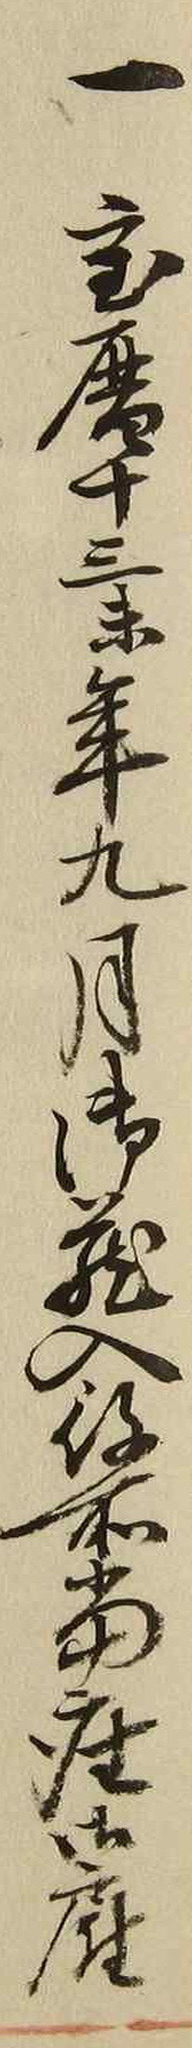一宝暦十三未年九月御蔵入役所当座御雇
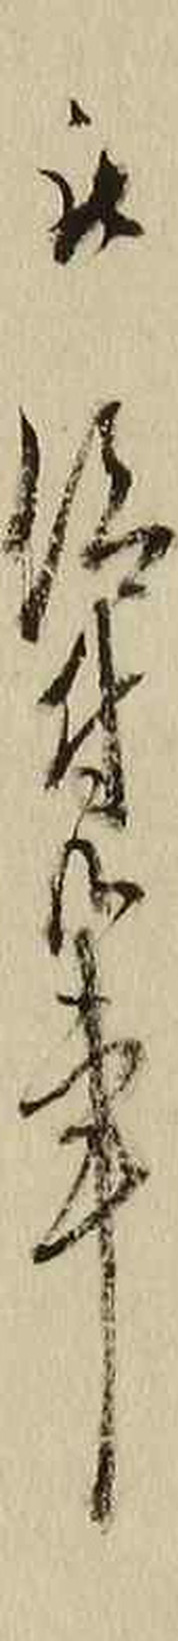被仰付候事
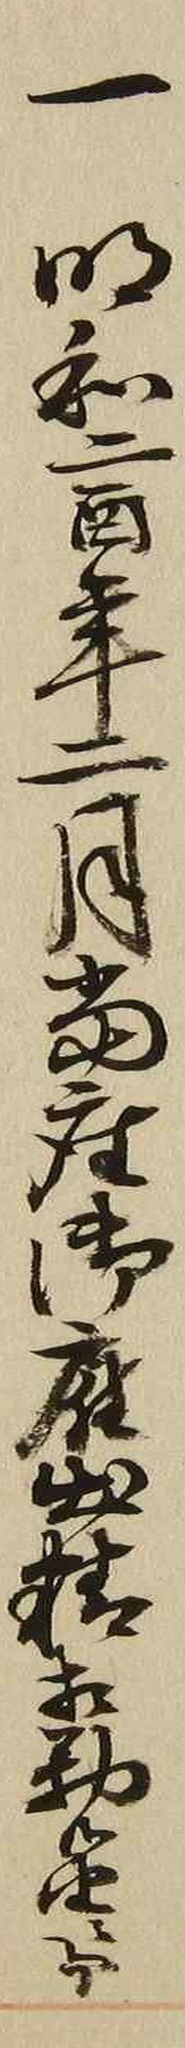一明和二酉年二月当座御雇出精相勤候由に而
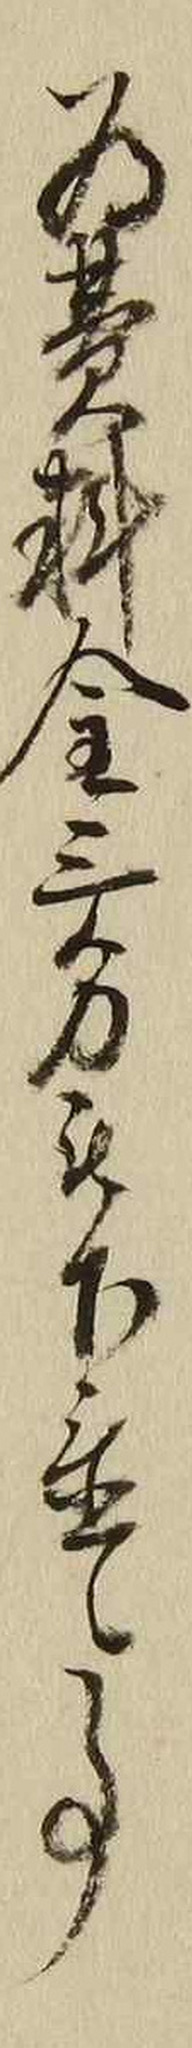為費料金三分被下置候事
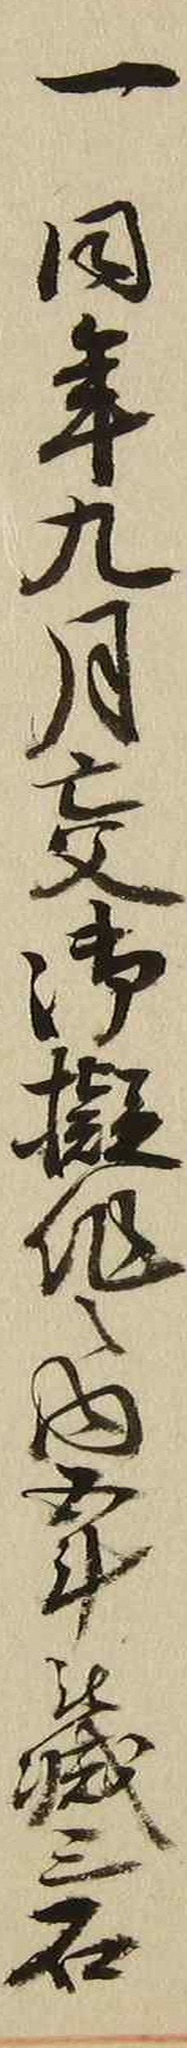一同年九月亡父御擬作之内五斗被減三石
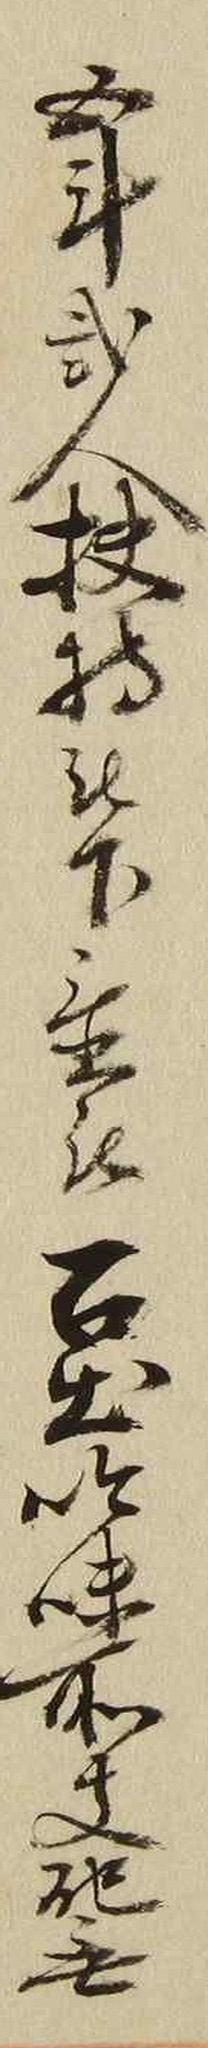五斗弐人扶持被下置被召出吟味所支配無
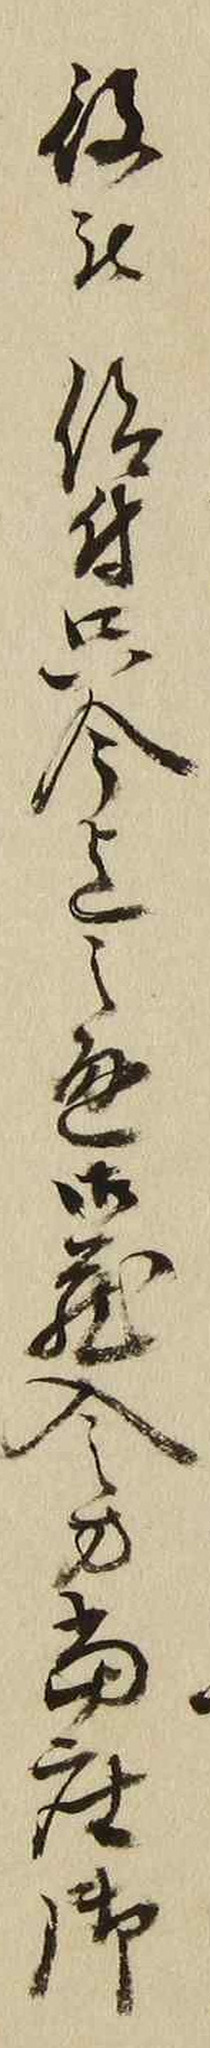役被仰付只今迄之通御蔵入之方当座御
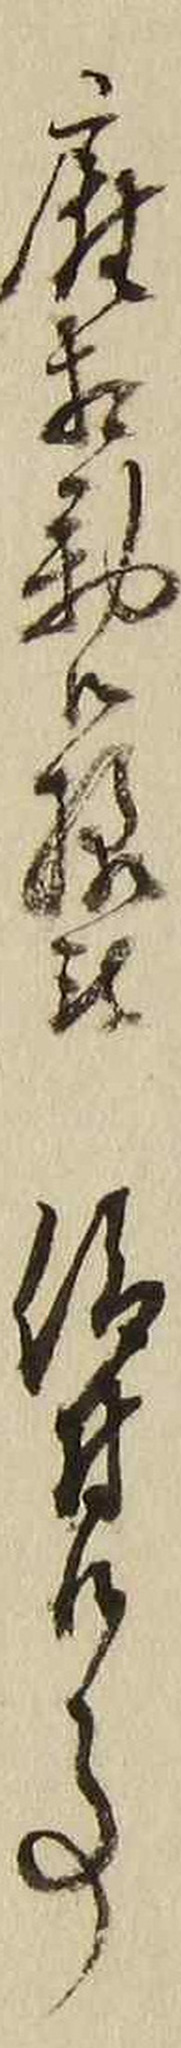雇相勤候被仰付候事
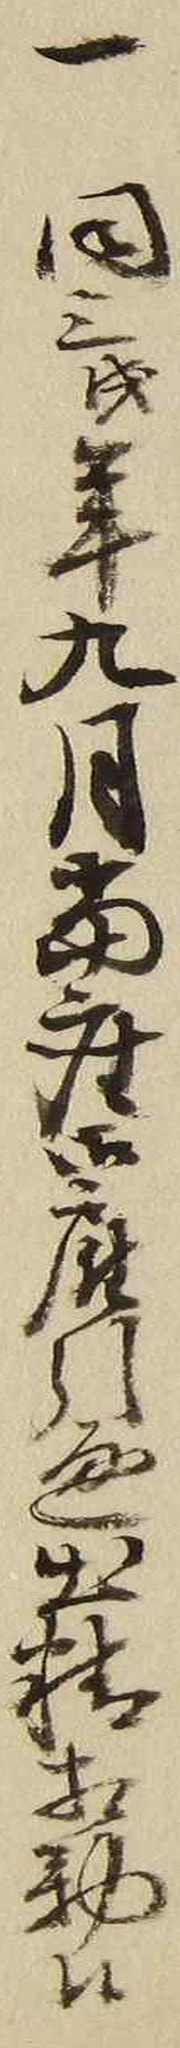一同三戌年九月当座御雇引通出精相勤候
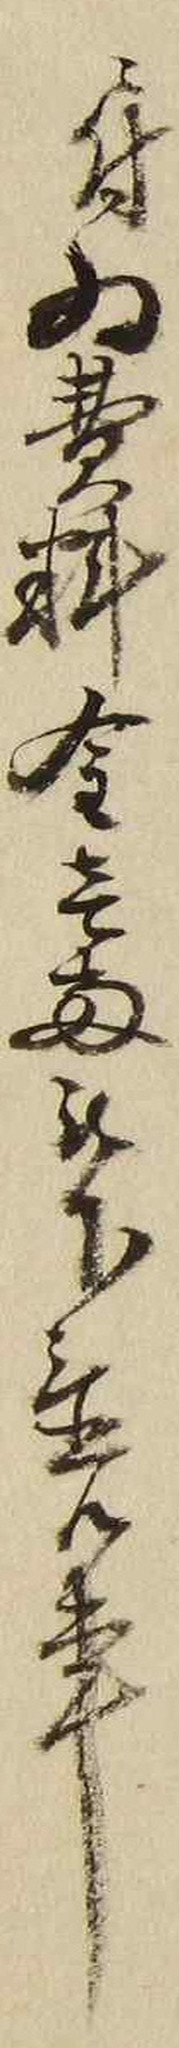に付為費料金壱両被下置候事

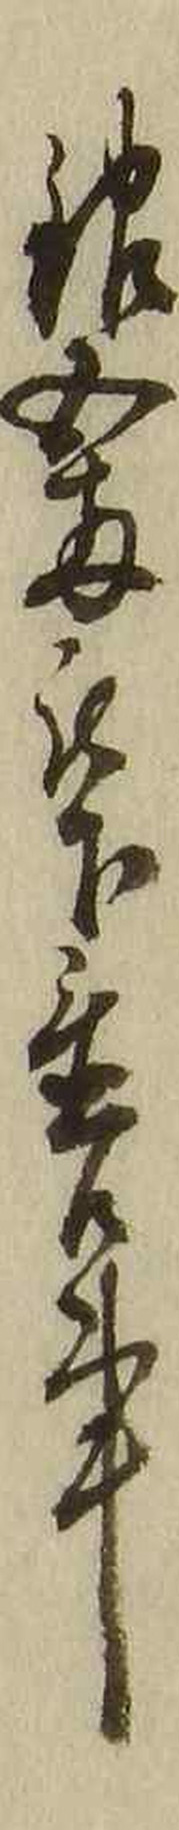銀五両被下置候事
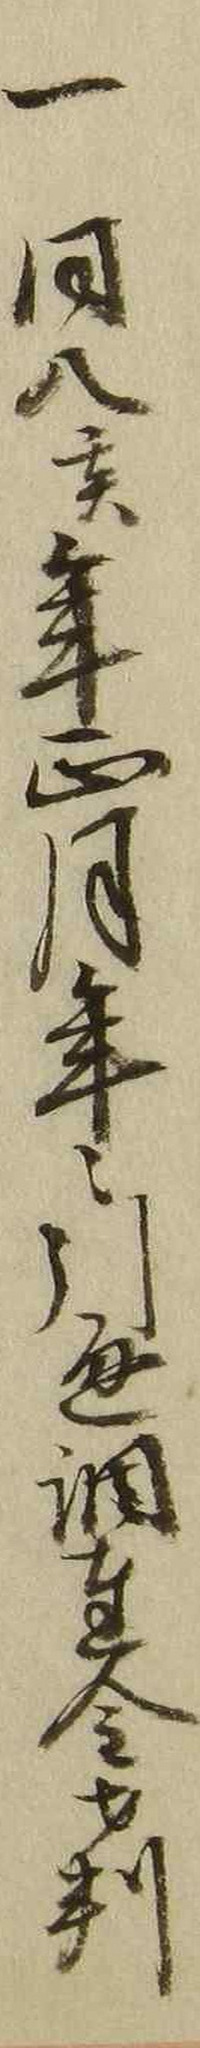一同八亥年正月年々引通調達金才判
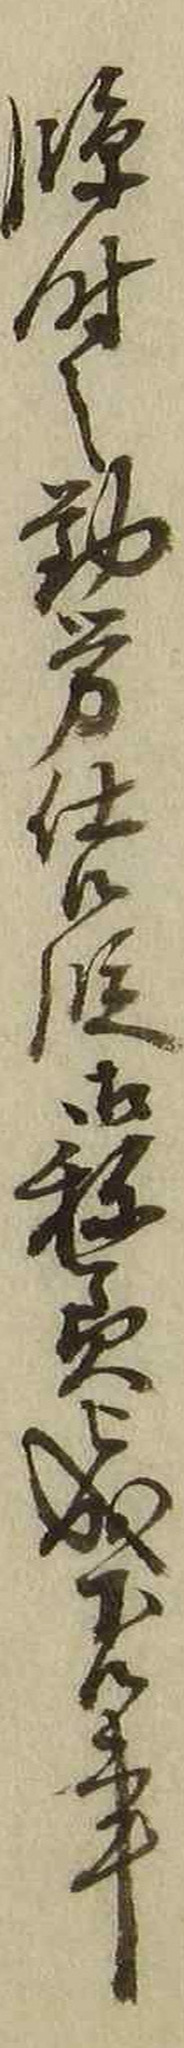臨時之勤労仕候段御称美被成下候事
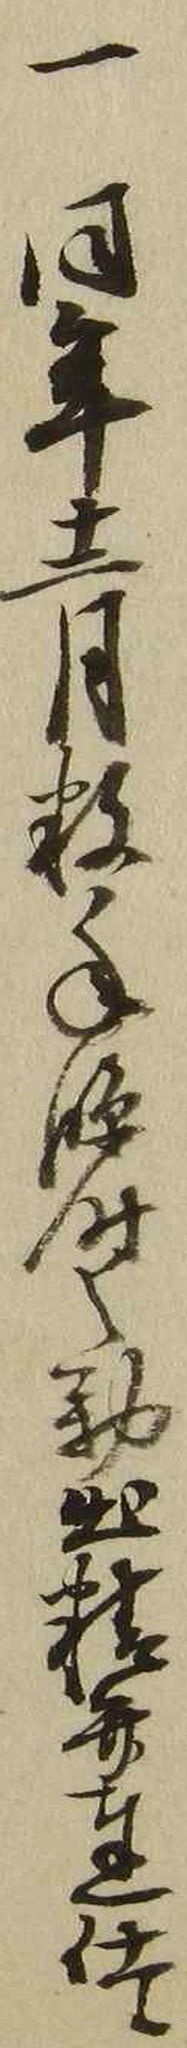一同年十二月数年臨時之勤出精弁達仕候
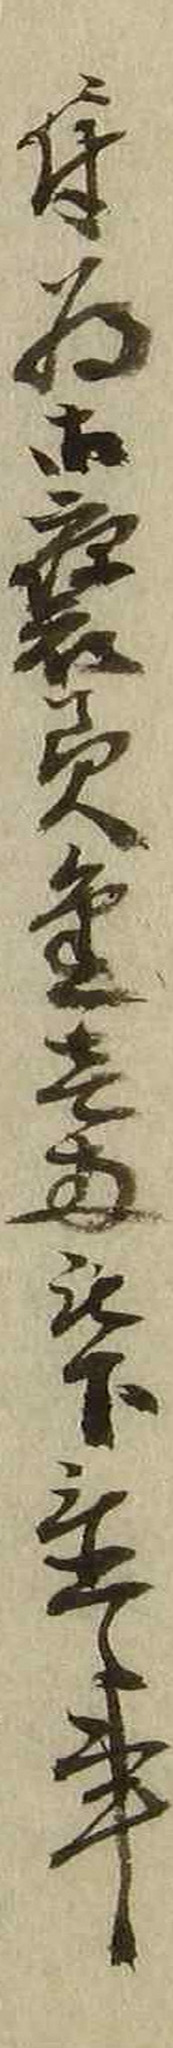に付為御褒美金壱両被下置候事
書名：諸士系譜　巻之38　は之部6
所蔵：会津若松市立会津図書館
